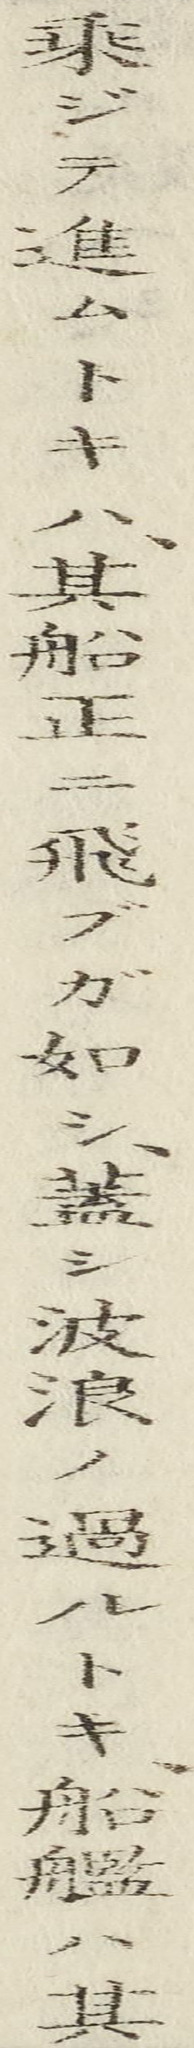乗ジテ進ムトキハ、其船正ニ飛ブガ如シ、蓋シ波浪ノ過ルトキ、船艦ハ其
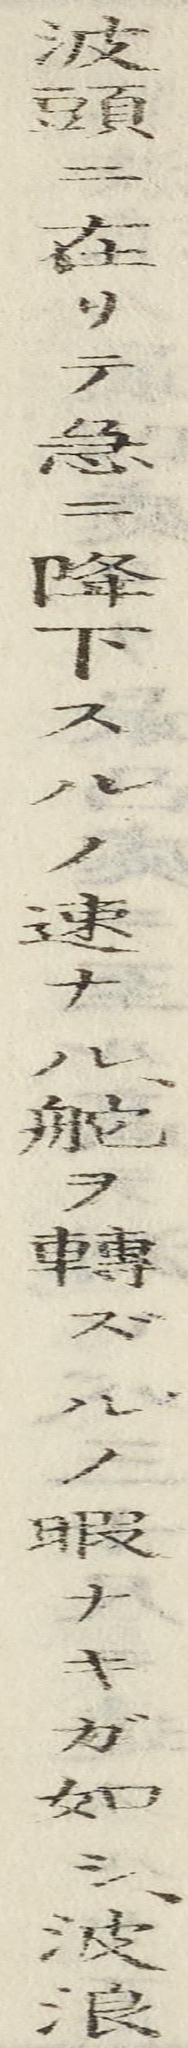波頭ニ在リテ急ニ降下スルノ速ナル、舵ヲ転ズルノ暇ナキガ如シ、波浪
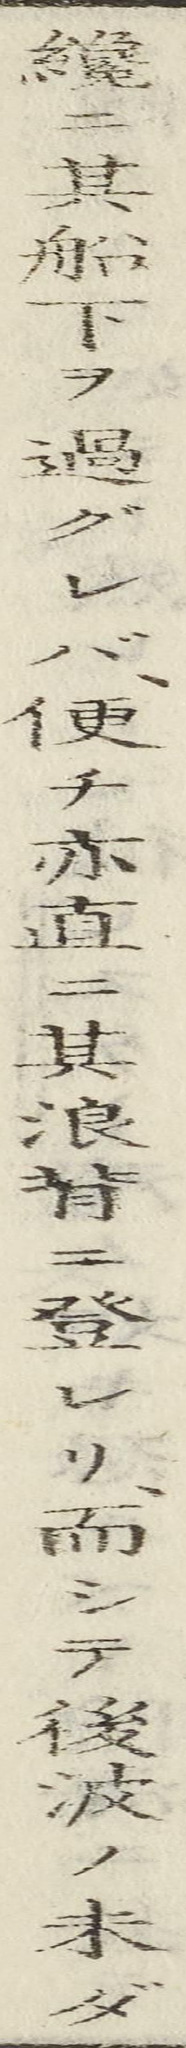纔ニ其船下ヲ過グレバ、便チ亦直ニ其浪背ニ登レリ、而シテ後波ノ未ダ
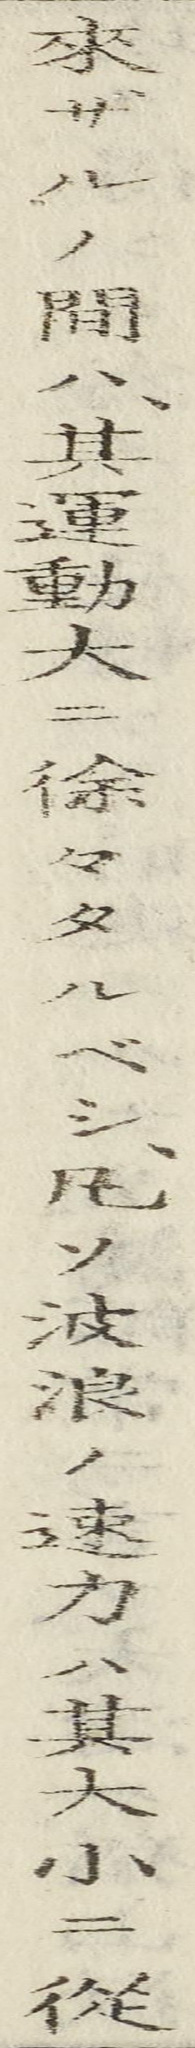来ザルノ間ハ、其運動大ニ徐々タルベシ、凡ソ波浪ノ速力ハ其大小ニ従
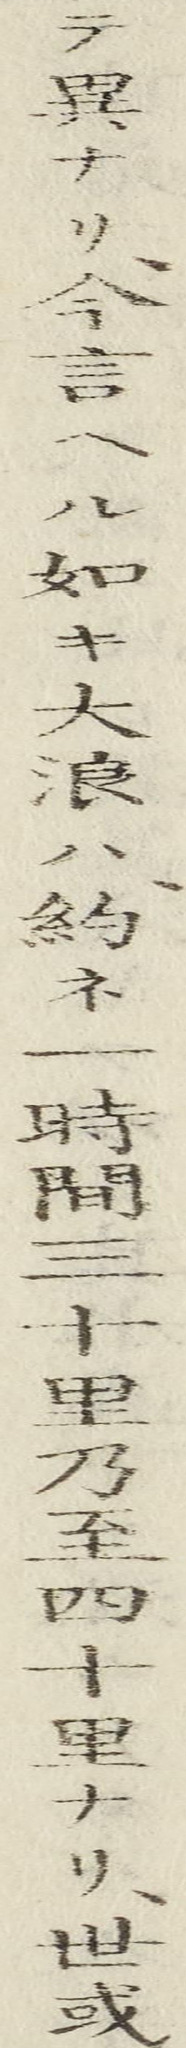テ異ナリ、今言ヘル如キ大浪ハ、約ネ一時間三十里乃至四十里ナリ、世或
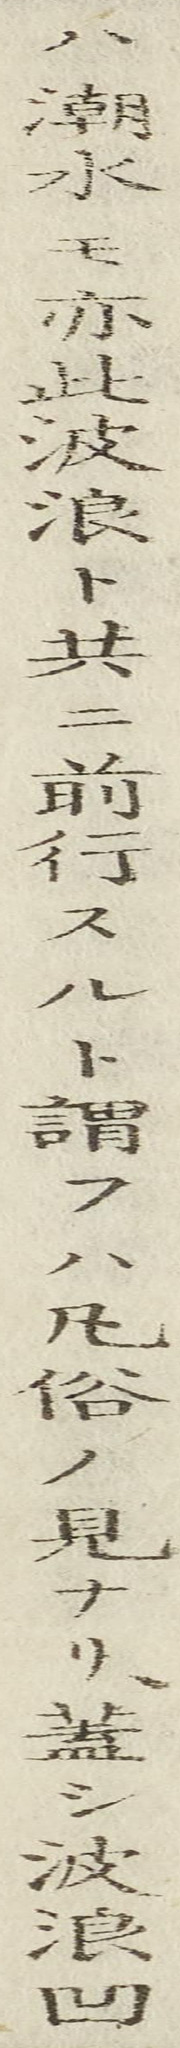ハ潮水モ亦此波浪ト共ニ前行スルト謂フハ凡俗ノ見ナリ、蓋シ波浪凹
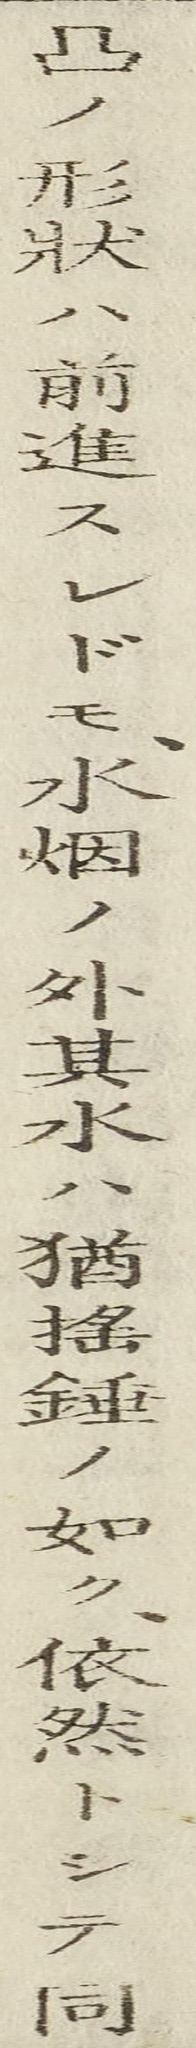凸ノ形状ハ前進スレドモ、水烟ノ外其水ハ猶揺錘ノ如ク、依然トシテ同
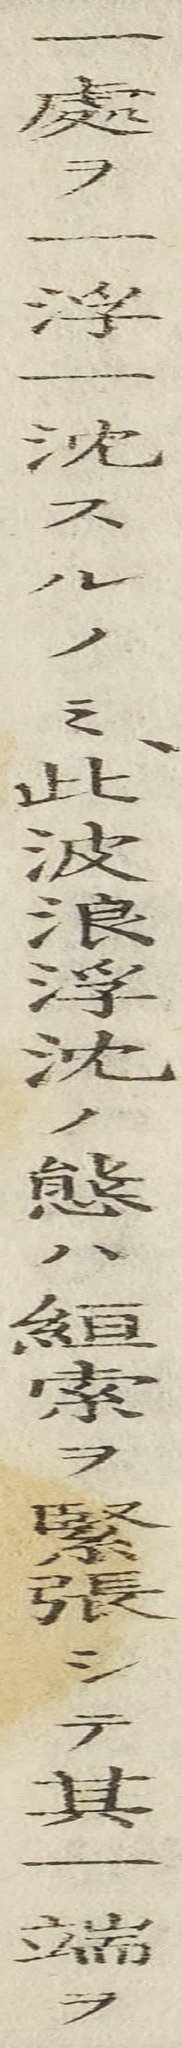一処ヲ一浮一沈スルノミ、此波浪浮沈ノ態ハ絙索ヲ緊張シテ其一端ヲ

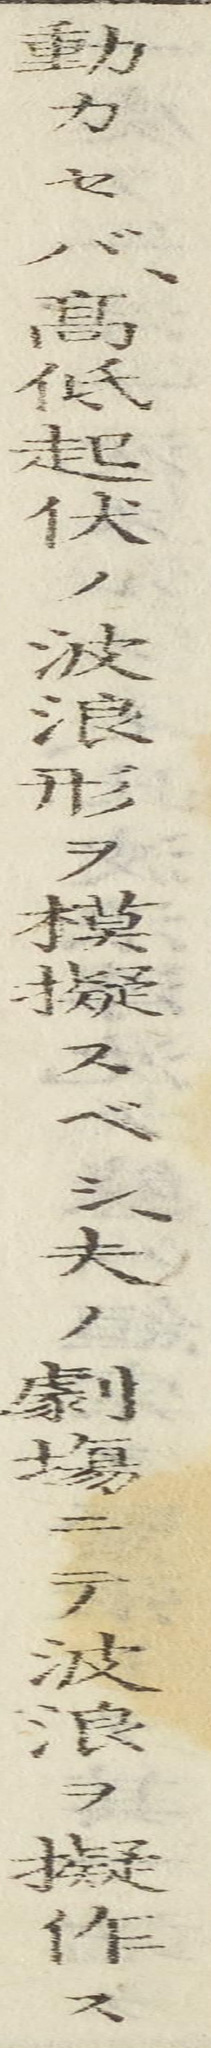動カセバ、高低起伏ノ波浪形ヲ模擬スベシ、夫ノ劇場ニテ波浪ヲ擬作ス
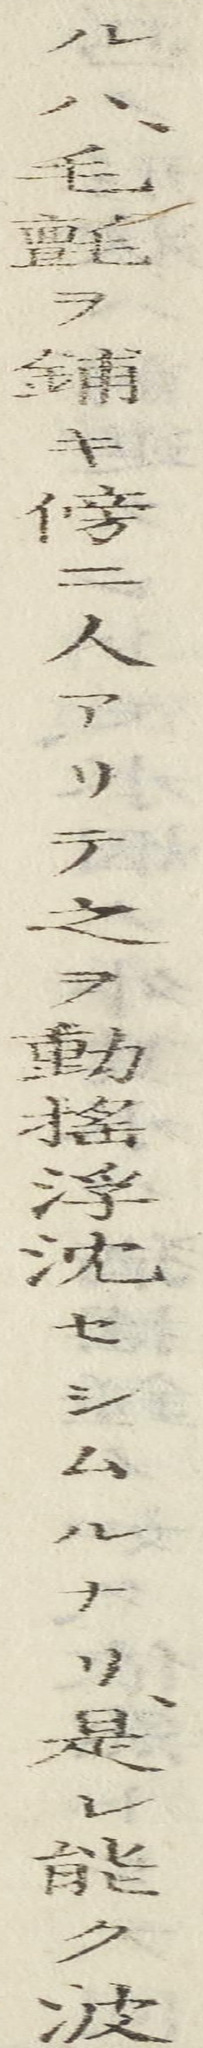ルハ、毛氈ヲ鋪キ傍ニ人アリテ之ヲ動揺浮沈セシムナリ、是レ能ク波
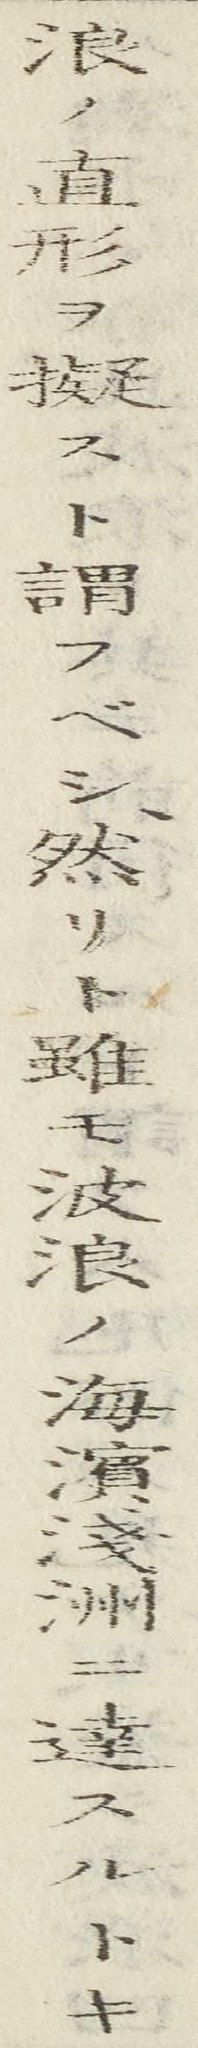浪ノ直形ヲ擬スト謂フベシ、然リト雖モ波浪ノ海浜浅洲ニ達スルトキ
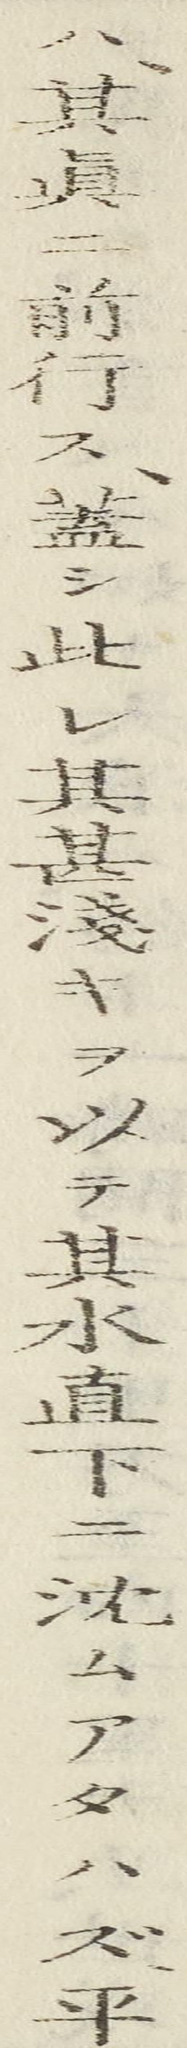ハ、其真ニ前行ス、蓋シ此レ其甚浅キヲ以テ其水直下ニ沈ムアタハズ、平
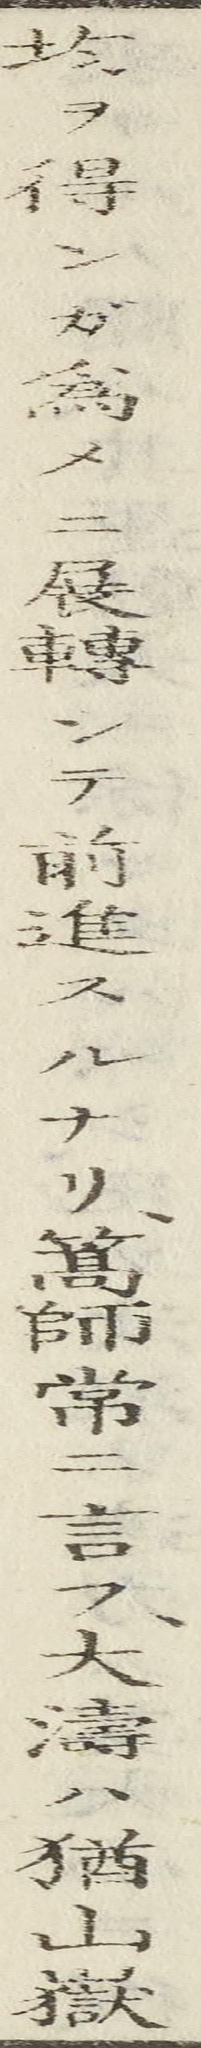均ヲ得ンガ為メニ展転シテ前進スルナリ、篙師常ニ言フ、大濤ハ猶山嶽
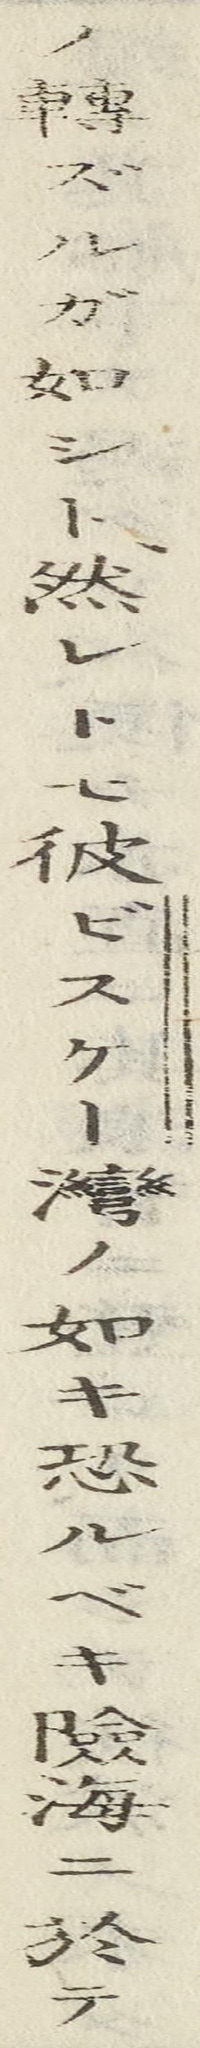ノ転ズルガ如シト、然レトモ彼ビスケー湾ノ如キ恐ルベキ険海ニ於テ
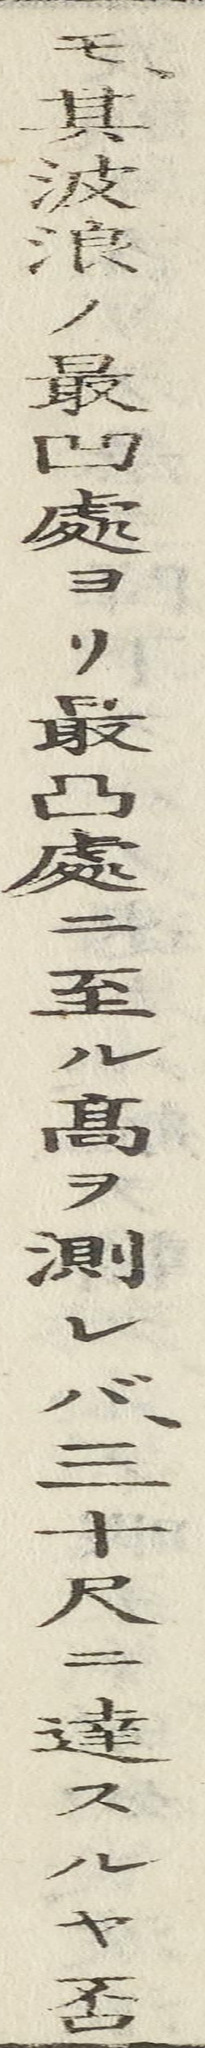モ、其波浪ノ最凹処ヨリ最凸処ニ至ル高ヲ測レバ、三十尺ニ達スルヤ否
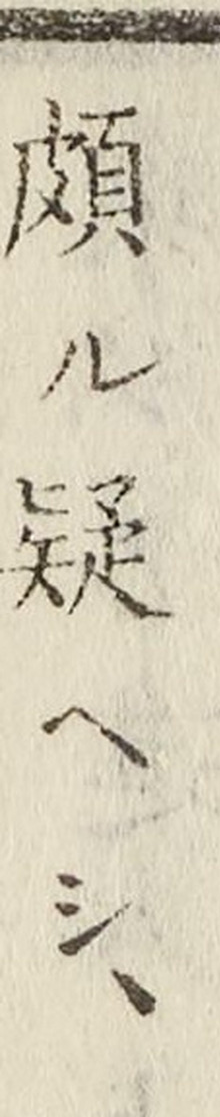頗ル疑ヘシ、
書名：百科全書　地文學　全
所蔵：東京大学地震研究所図書室 Earthquake Research Institute Library, The University of Tokyo, JAPAN
